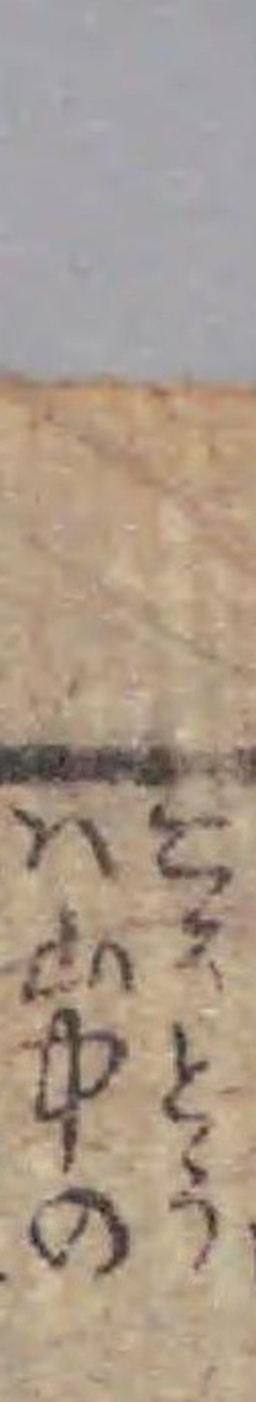は山中の
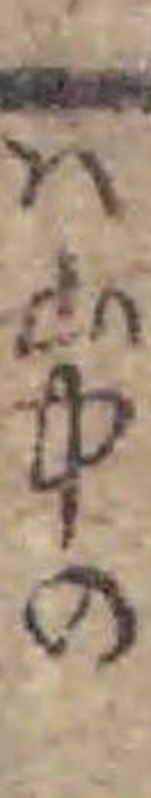は山中の
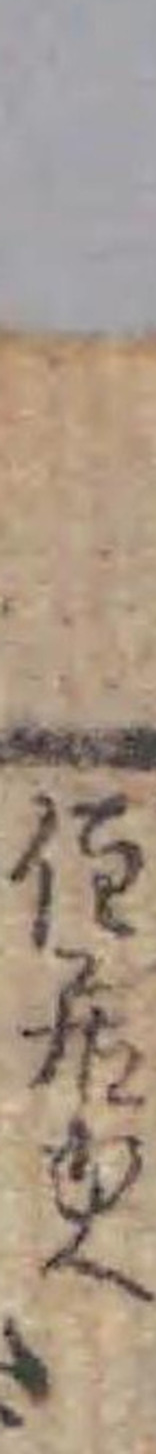住居ゆへ
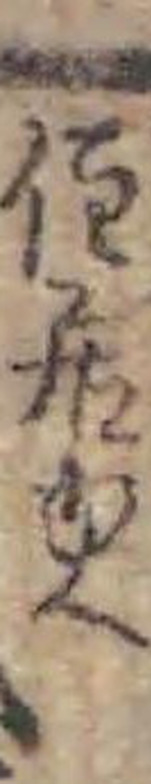住居ゆへ
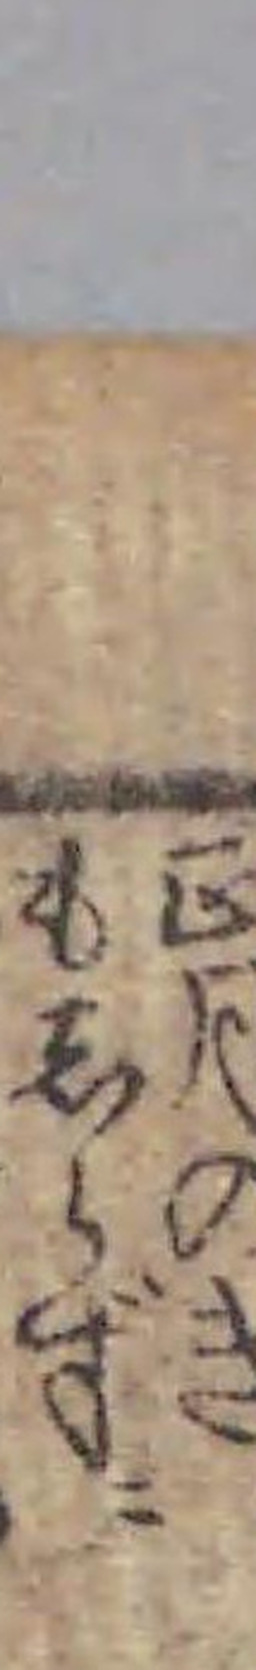もしらずに
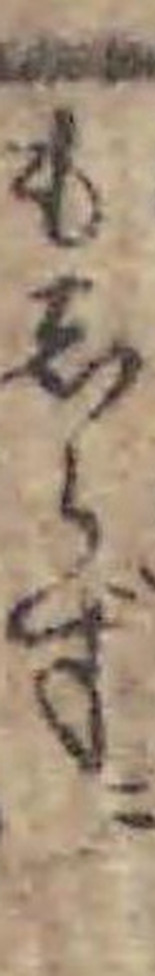もしらずに
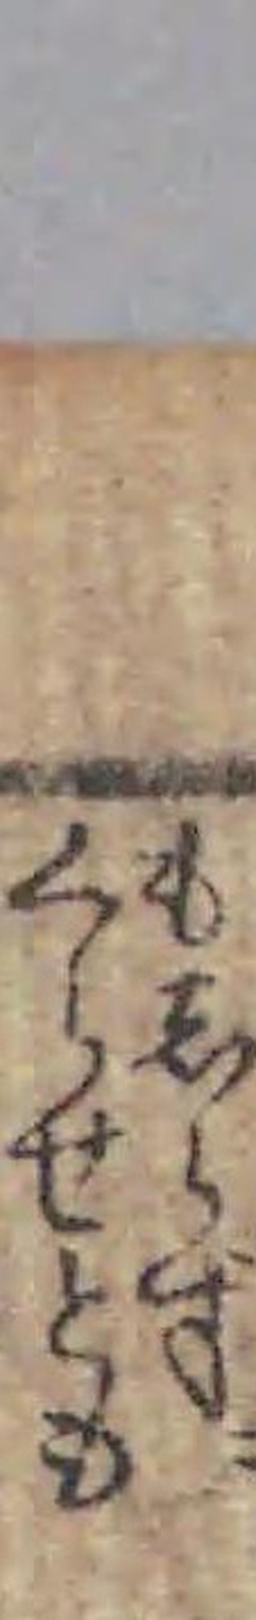くらせとも
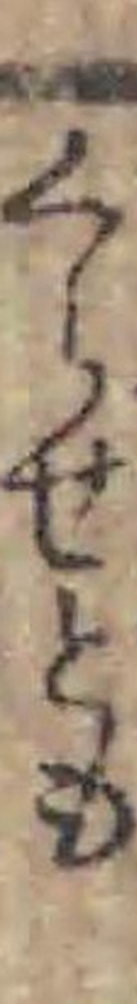くらせとも
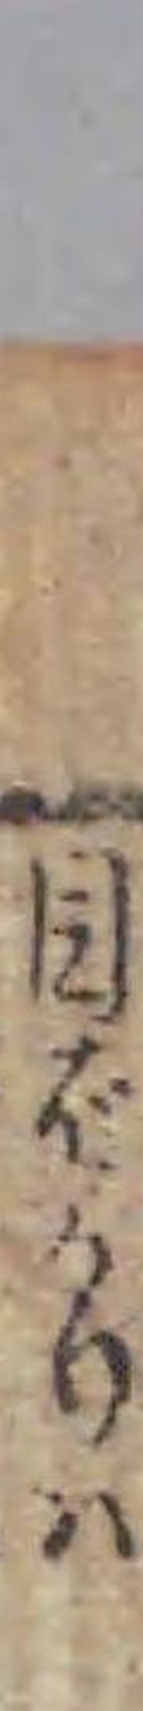目ばかりは
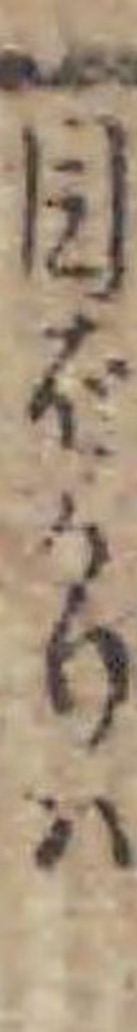目ばかりは
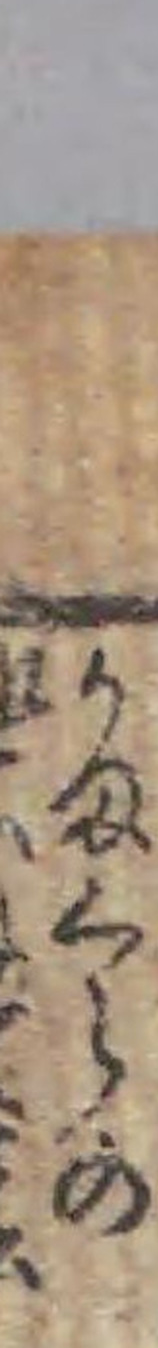かまくらの
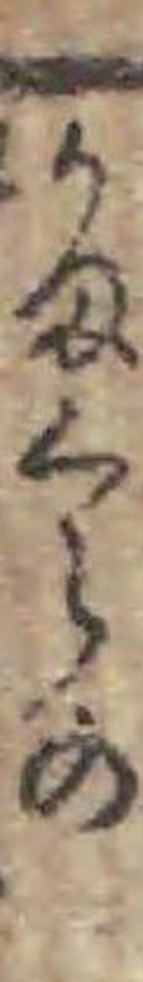かまくらの
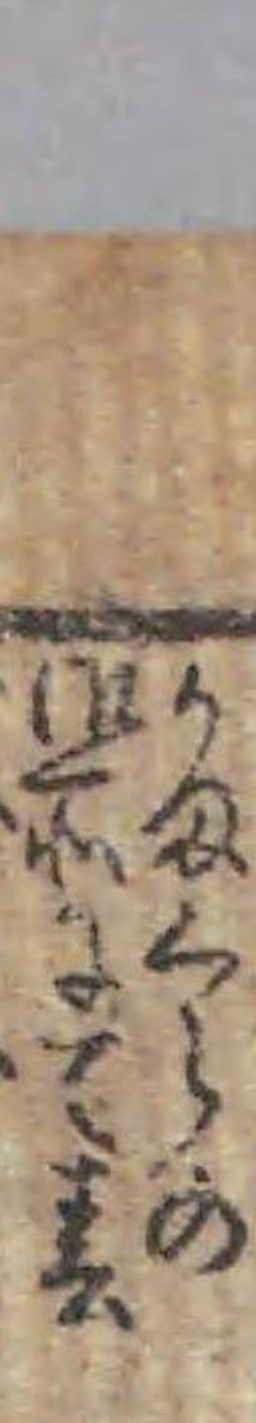御所にて春
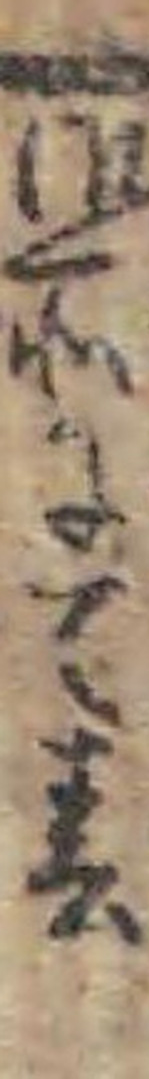御所にて春
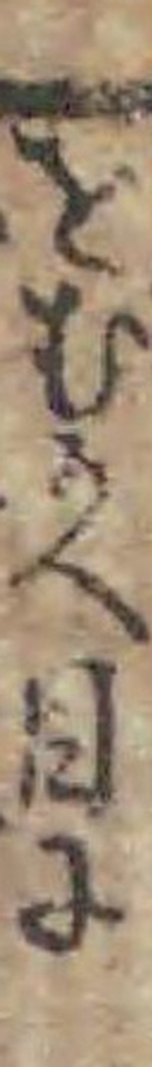をむかへ目に
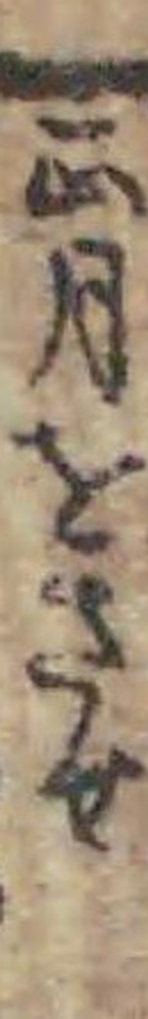正月をさせ
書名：悪七変目景清 : 2巻
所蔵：国立国会図書館 National Diet Library, JAPAN
